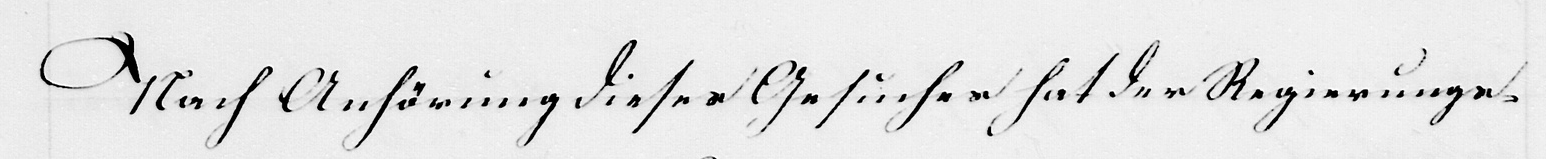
Nach Anhörung dieses Gesuches hat der Regierungs¬
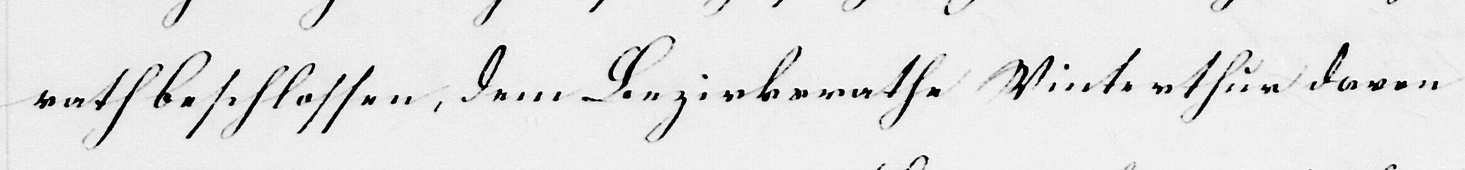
rath beschlossen, dem Bezirksrathe Winterthur davon
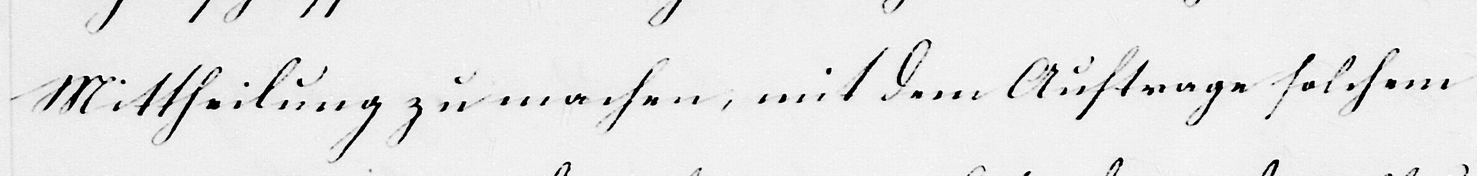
Mittheilung zu machen, mit dem Auftrage solchem
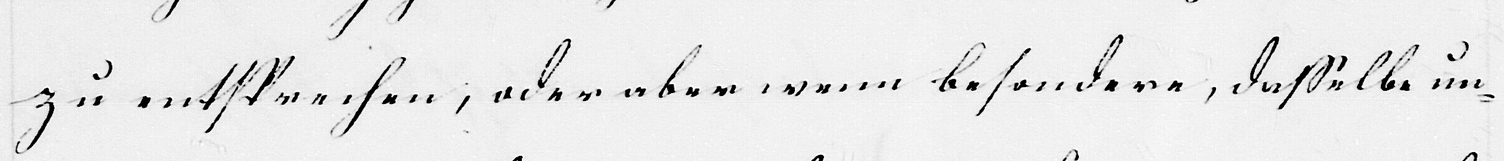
zu entsprechen, oder aber wenn besondere, daßelbe un¬
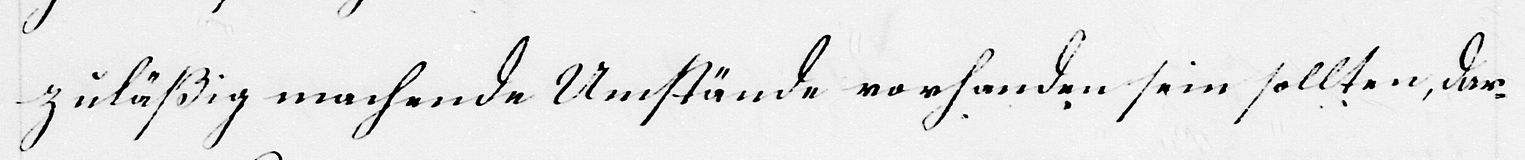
zuläßig machende Umstände vorhanden sein sollten, dar¬
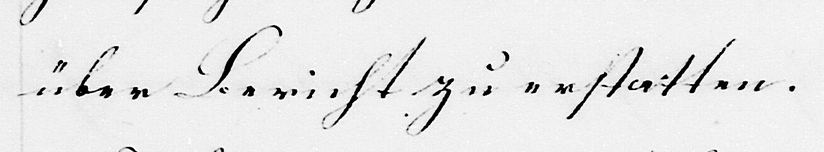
über Bericht zu erstatten.
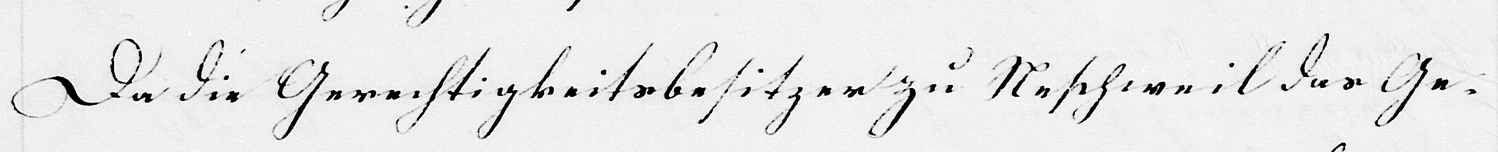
Da die Gerechtigkeitsbesitzer zu Neschweil das Ge¬
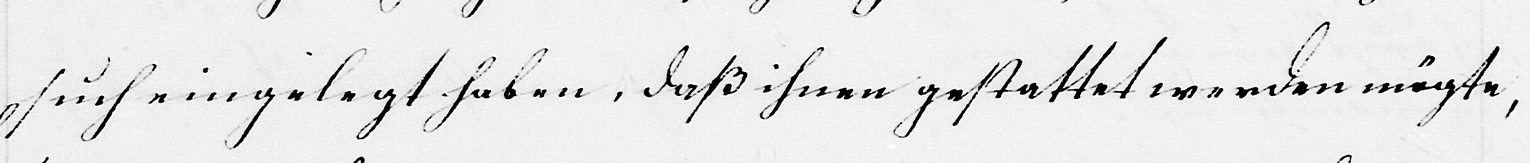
such eingelegt haben, daß ihnen gestattet werden mögte,
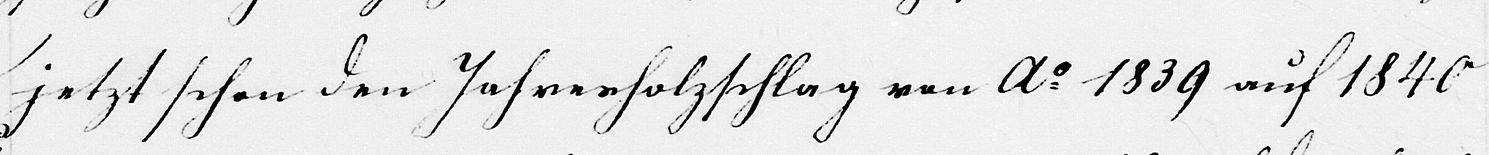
jetzt schon den Jahresholzschlag von Ao 1839 auf 1840
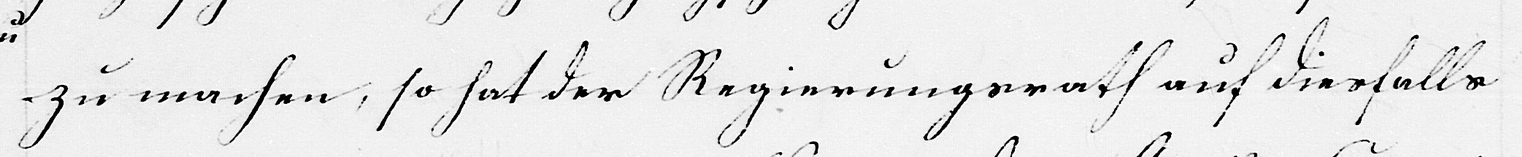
zu machen, so hat der Regierungsrath auf diesfalls
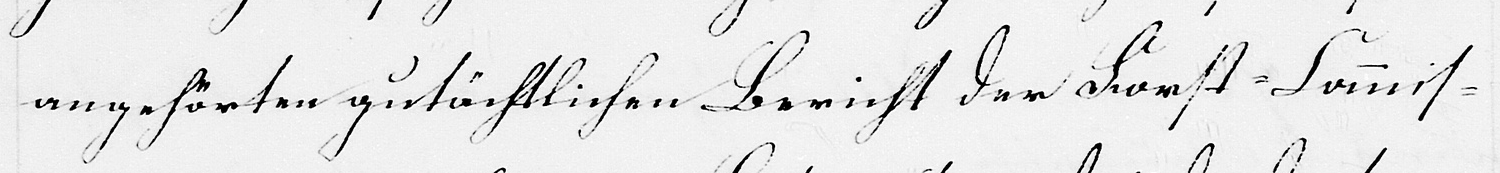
angehörten gutächtlichen Bericht der Forst-Commis¬
